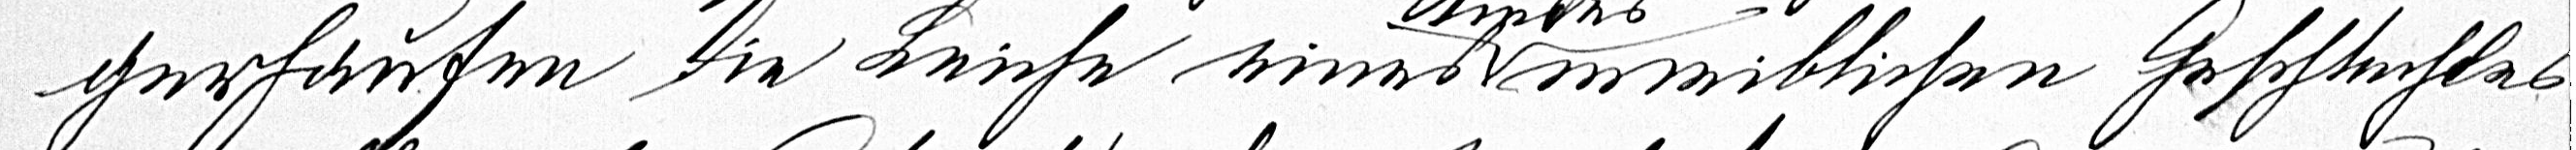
gerhaufen die Leiche eines weiblichen Geschlechtes
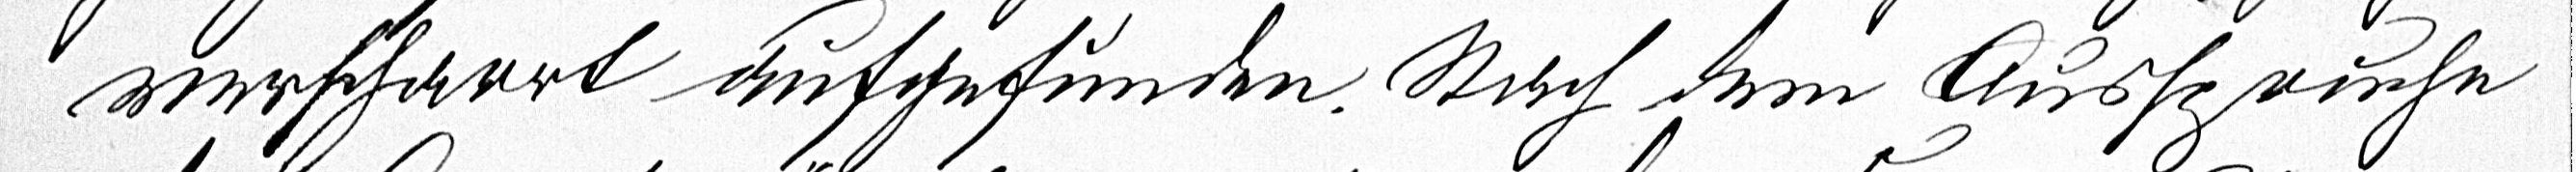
verscharrt aufgefunden. Nach dem Ausspruche
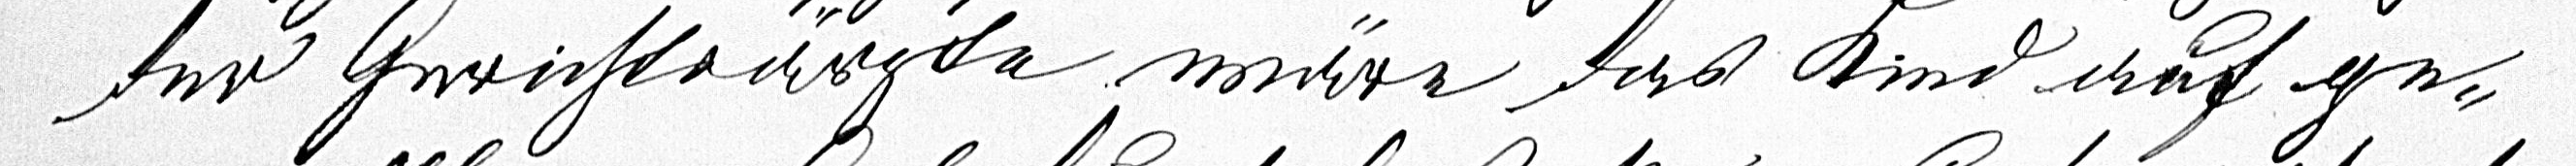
der Gerichtsärzte wäre das Kind auf ge¬
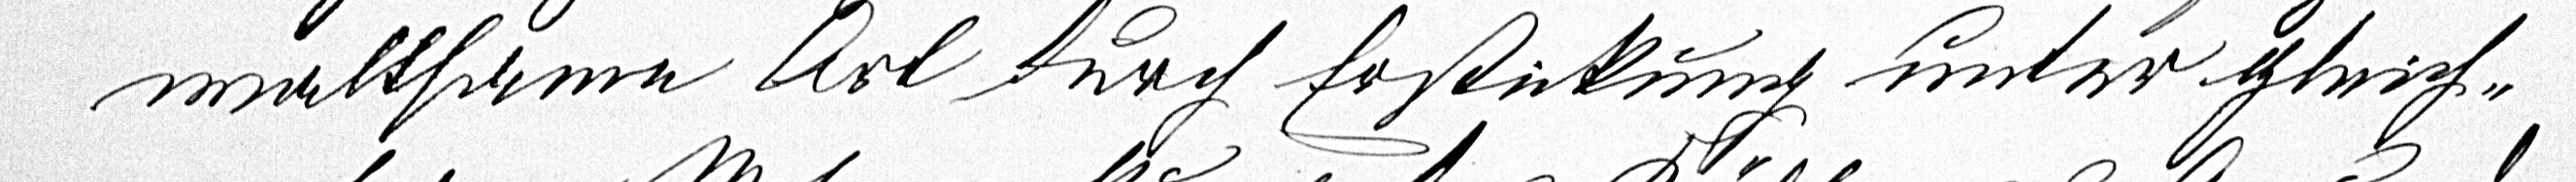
waltsame Art durch Erstickung unter gleich¬
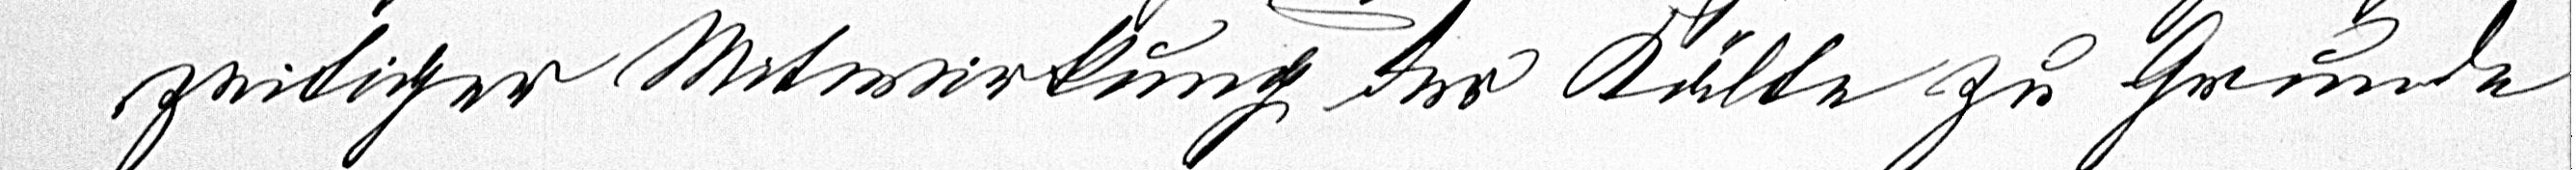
zeitiger Mitwirkung der Kälte zu Grunde
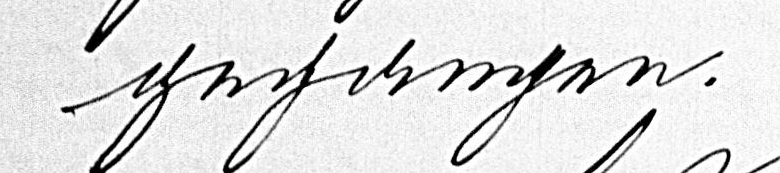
gegangen.
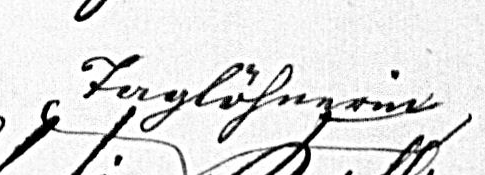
Taglöhnerin
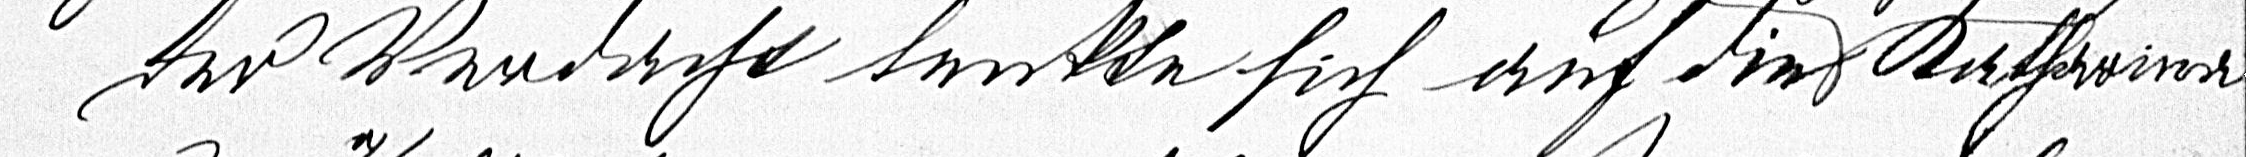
Der Verdacht lenkte sich auf die Katherina
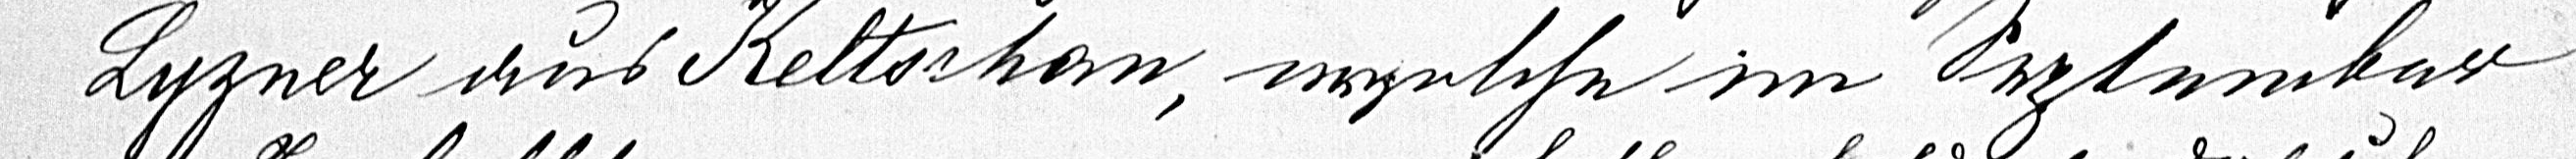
Lyzner aus Keltschan, welche im September
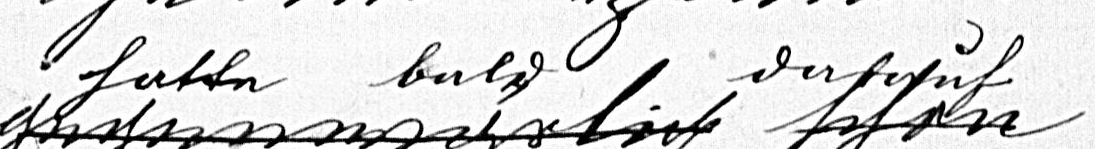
hatte bald darauf
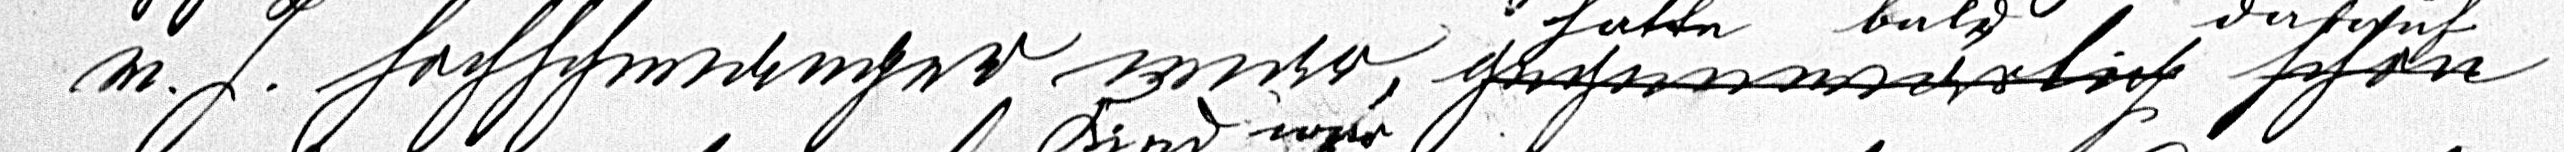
m. J. Hochschwanger war,
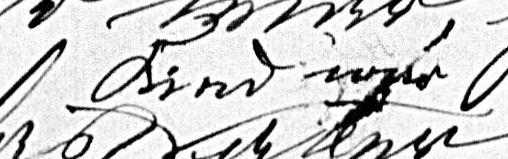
Kind war
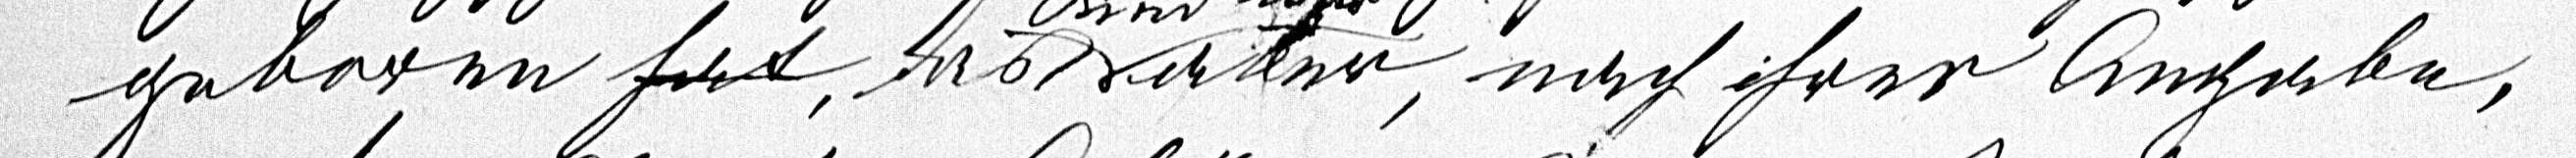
geboren, des aber, nach ihrer Angabe,
